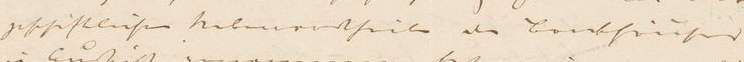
geschäftliche Nebenvortheile der Bankhäuser
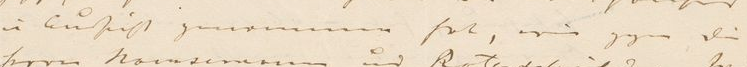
in Aussicht genommen hat, wie gegen die
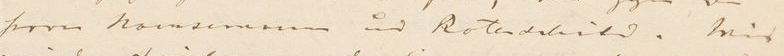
Herrn Hansemann und Rothschild. Wir
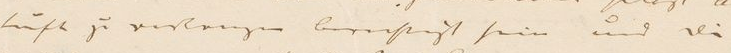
kunft zu verlangen berechtigt sein und die
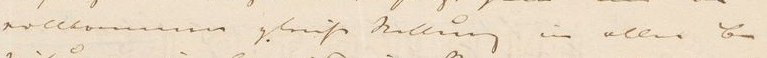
vollkommen gleiche Stellung in allen Be-
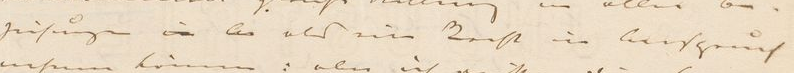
ziehungen inAn als ein Recht in Anspruch
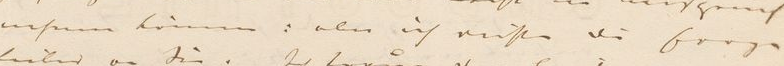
nehmen können: aber ich richte die Frage
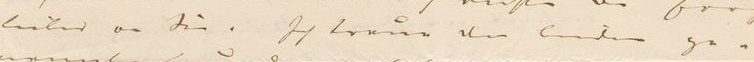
lieber an Sie. Ich traue den beiden ge-
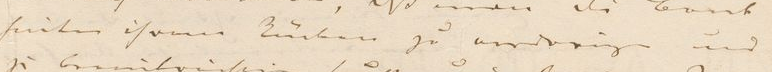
hinter ihrem Rücken zu verdrängen und
